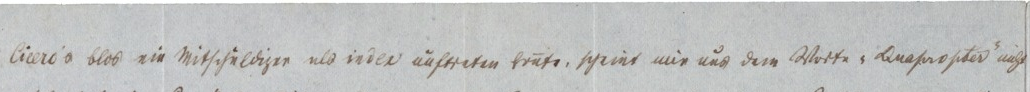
blos ein Mitschuldiger als index auftreten konnte, scheint mir aus dem Worte
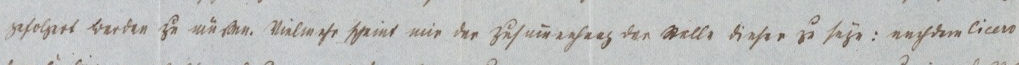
gefolgert werden zu müssen. Vielmehr scheint mir der Zusammenhang der Stelle dieser zu sein: nachdem Cicero
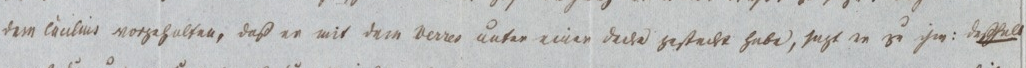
dem Cäcilius vorgehalten, daß er mit dem Verres unter einer Decke gesteckt habe, sagt er zu ihm: deßhalb
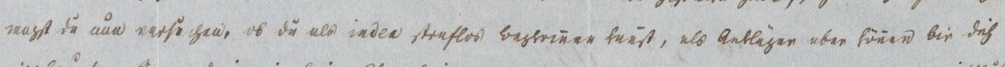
magst du nun versuchen, ob du als index straflos wegkommen kannst, als Ankläger aber können wir dich
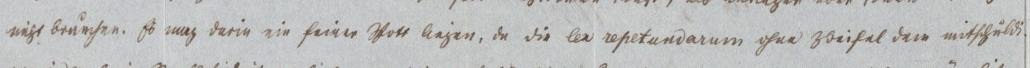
nicht brauchen. Es mag darin ein feiner Spott liegen, da die lex repetundarum ohne Zweifel dem mitschuldi-
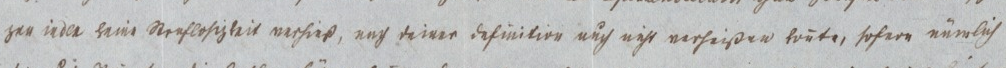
gen index keine Straflosigkeit verhieß, nach deiner Definition auch nicht verheißen konnte, sofern nämlich
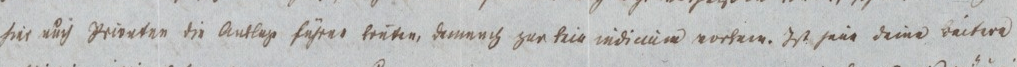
hier auch Private die Anklage führen konnten, demnach gar kein indicium vorlag. Ist jene deine weitere
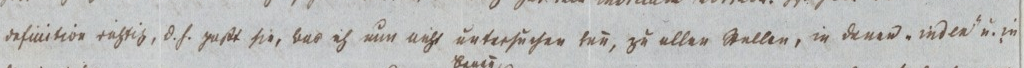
Definition richtig, d. h. paßt sie, was ich nun nicht untersuchen kann, zu allen Stellen, in denen «index» u. « in-
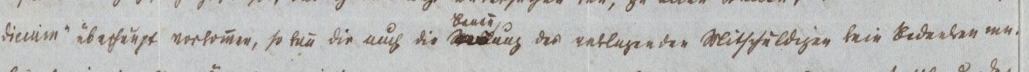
dicium» überhaupt vorkommen, so kann dir auch die ...Benennung des anklagenden Mitschuldigen kein Bedenken ma-
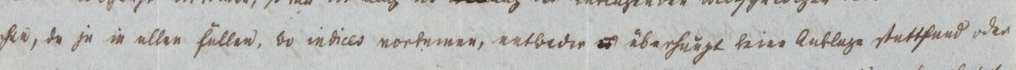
chen, da ja in allen Fällen, wo indices vorkommen, entweder ... überhaupt keine Anklage stattfand oder
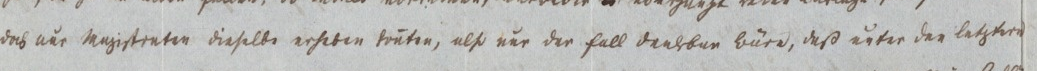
das nur Magistraten dieselbe erheben konnten, also nur der Fall denkbar wäre, daß unter den letztern
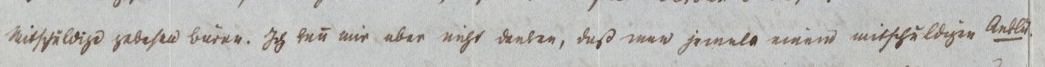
Mitschuldige gewesen wären. Ich kann mir aber nicht denken, daß man jemals einem mitschuldigen Anklä-
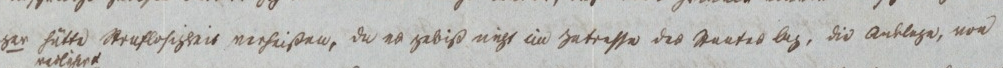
ger hätte Straflosigkeit verheißen, da es gewiß nicht im Intresse des Staates lag, die Anklage, von
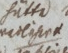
deren redlicher
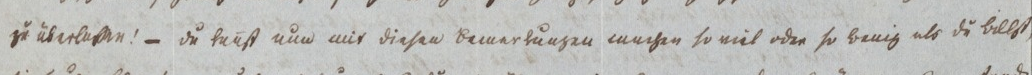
zu überlassen! – Du kannst nun mit diesen Bemerkungen machen so viel oder so wenig als du willst,
